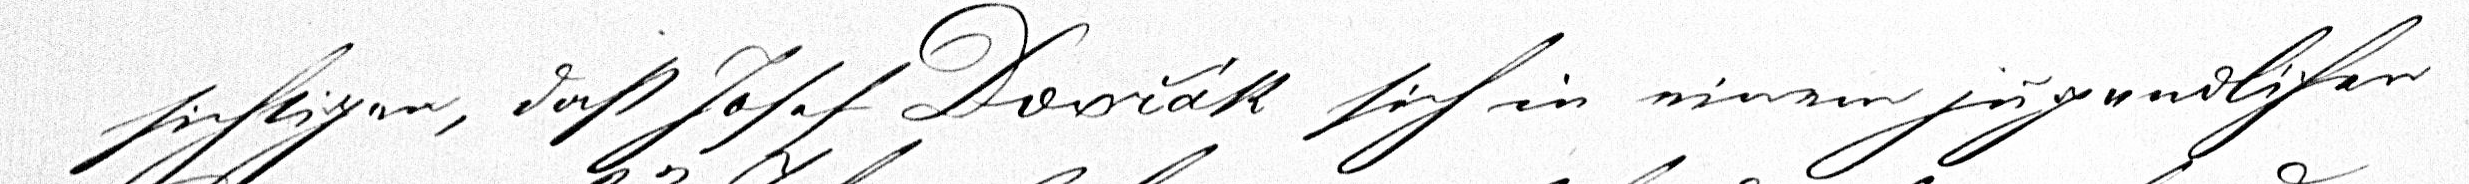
sichtigen, daß Josef Dvořák sich in einen jugendlichen
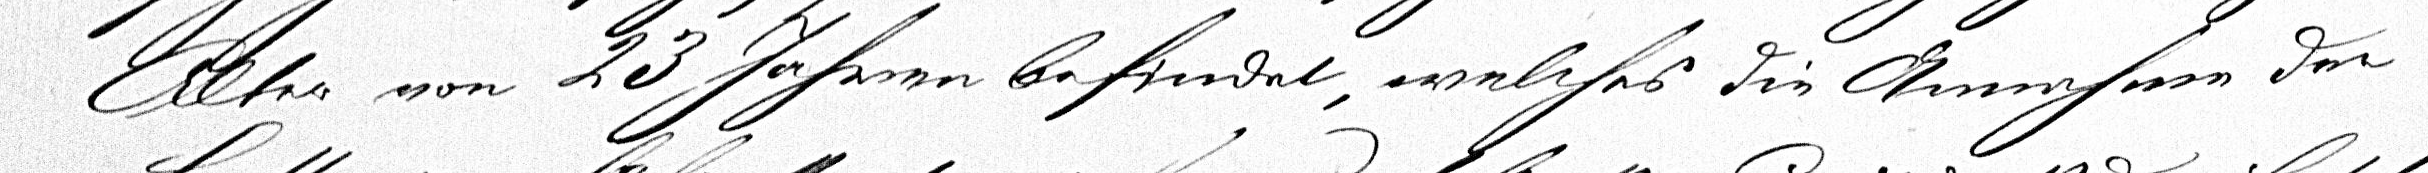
Alter von 23 Jahren befindet, welches die Annehme der
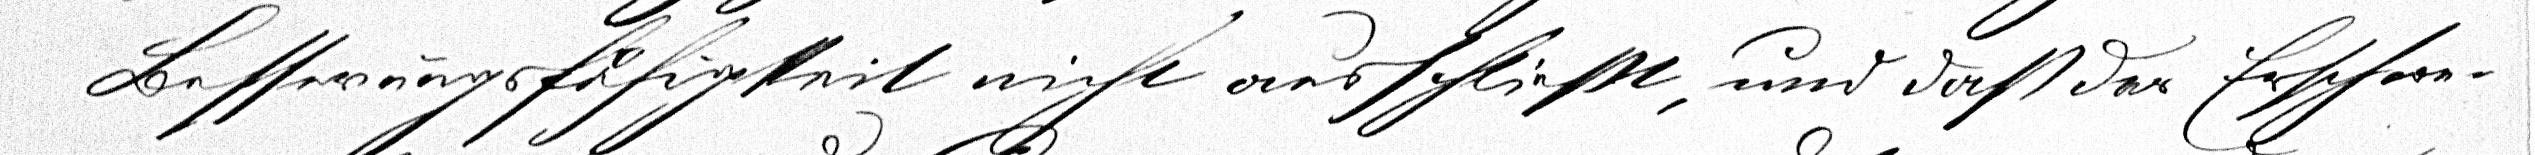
Besserungsfähigkeit nicht ausschließt, und daß der Erschwe¬
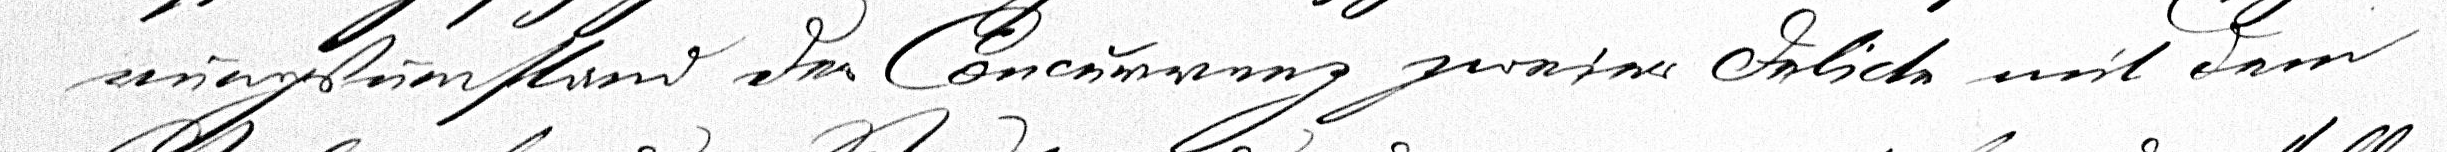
rungsumstand der Concurrenz zweier Delicte mit dem
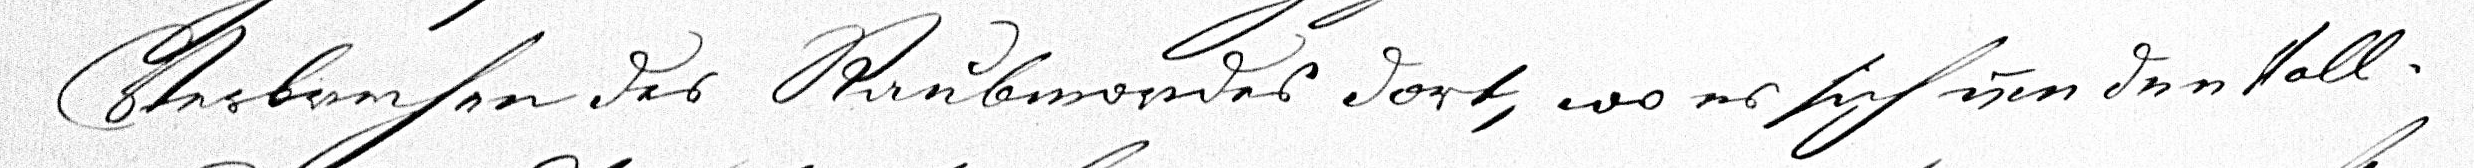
Verbrechen des Raubmordes dort, wo es sich um den Voll¬
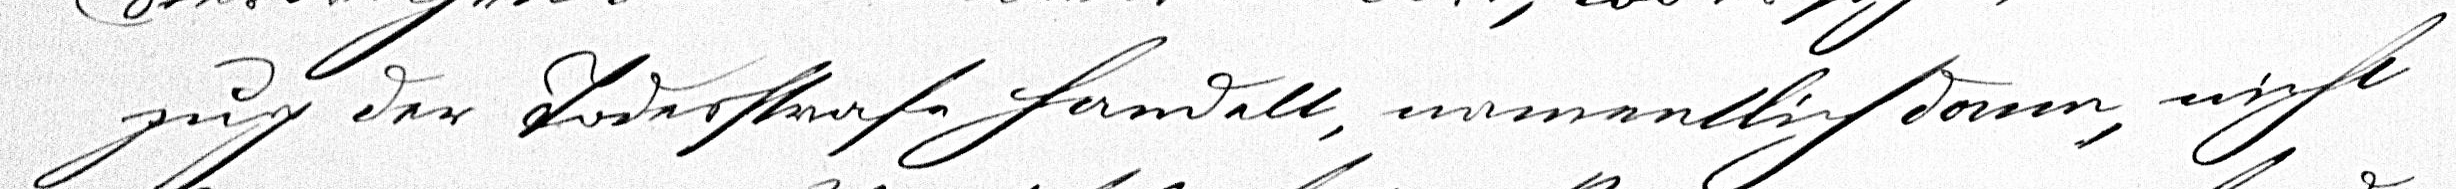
zug der Todesstrafe Handelt, namentlich dann, nicht
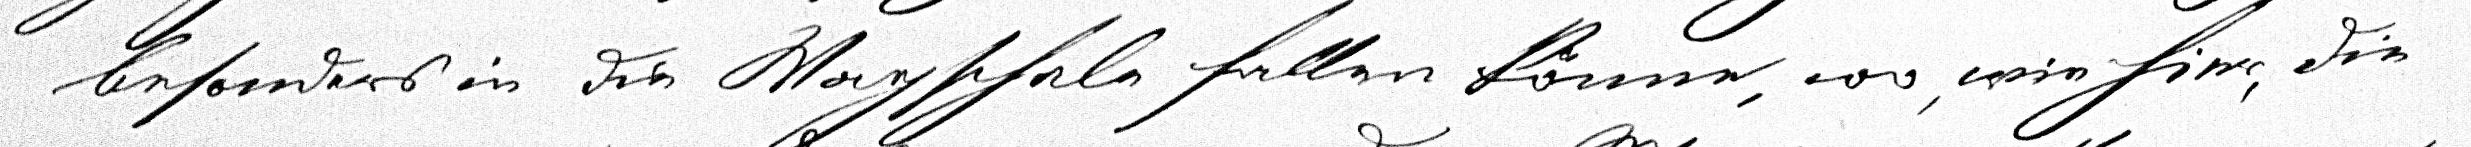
besonders in die Wag schale fallen könne, wo, wie hier, die
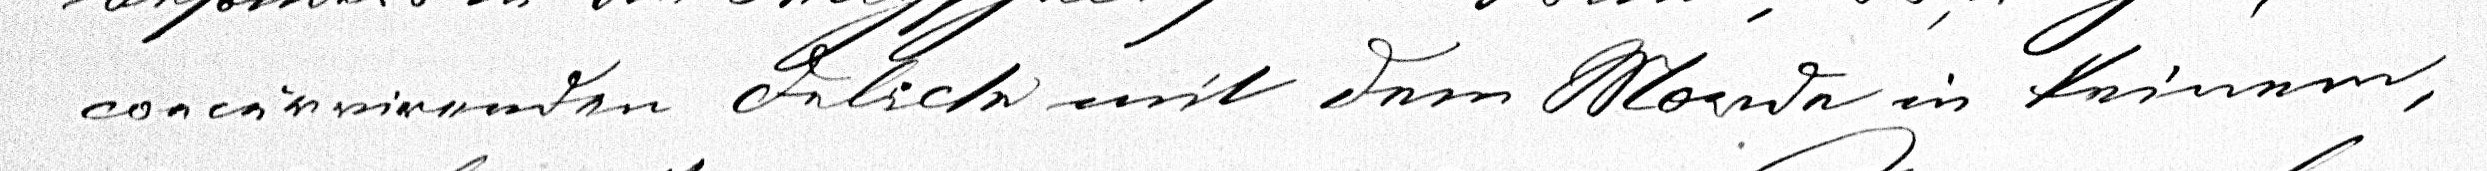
concurrirenden Delicte mit dem Morde in keinem,
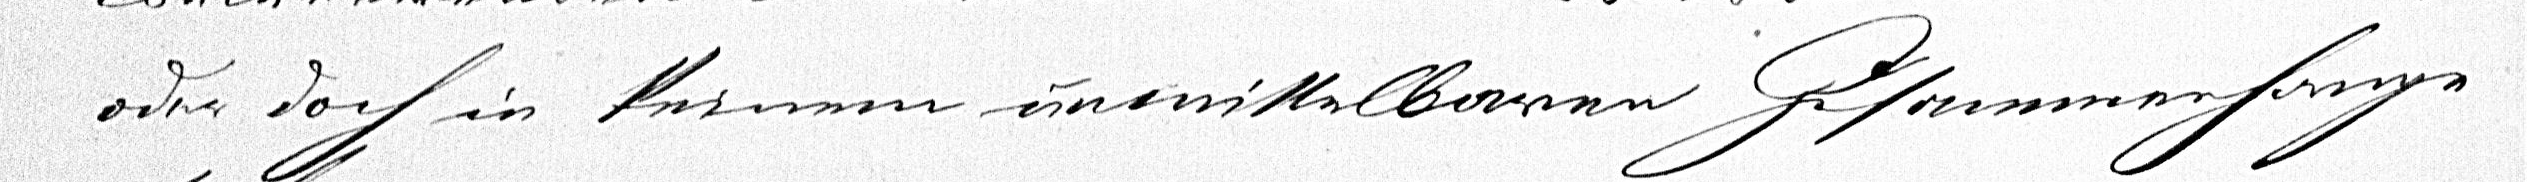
oder doch in keinem unmittelbaren Gesammenhange
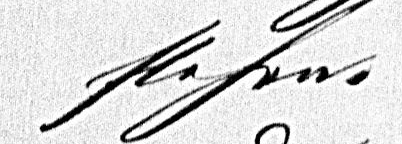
stehen.
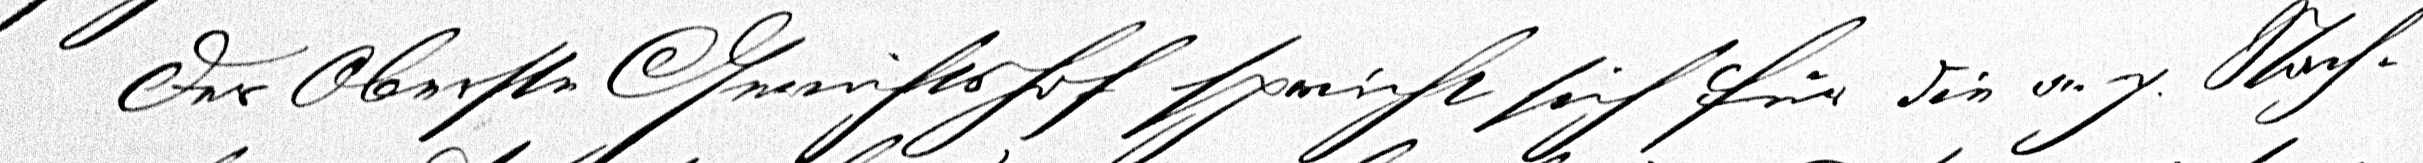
Der Oberste Gerichtshof spricht sich für die a. g. Nach¬
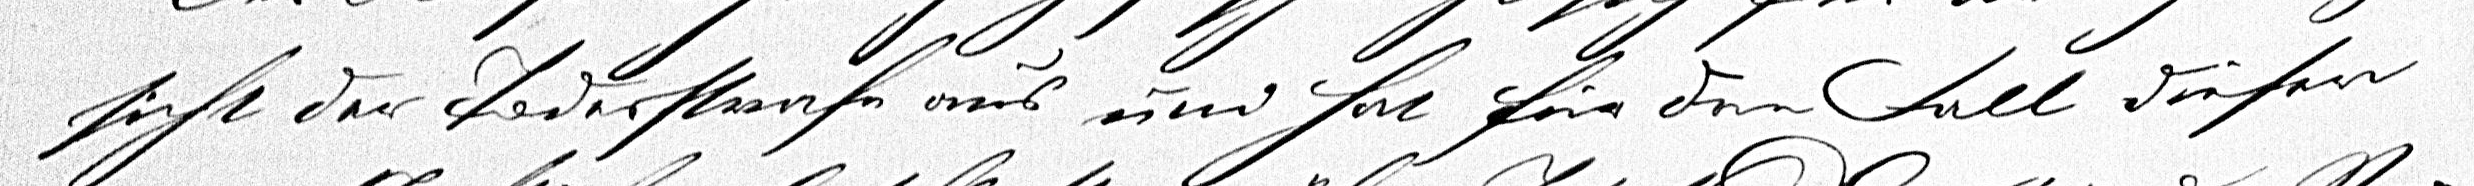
sicht der Todesstrafe aus und hat für den Fall dieser
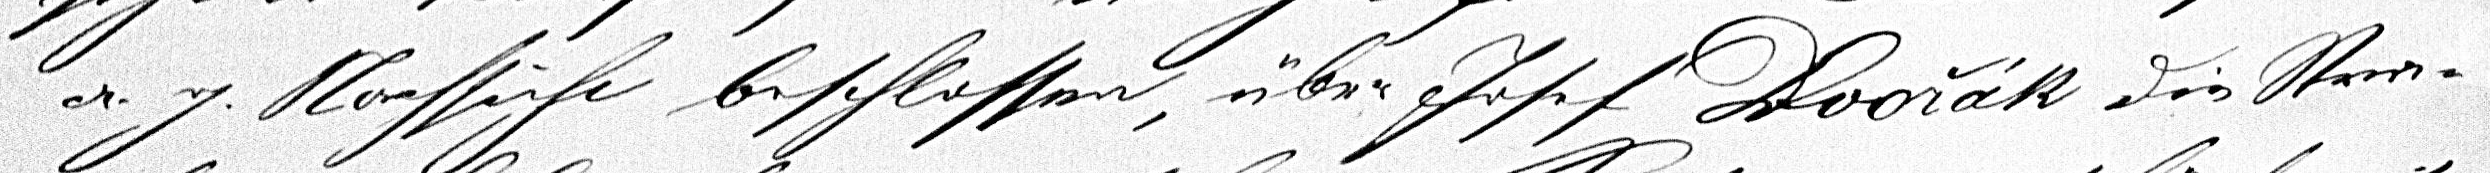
a. g. Nachsicht beschlossen, über Josef Dvořák die Stra¬
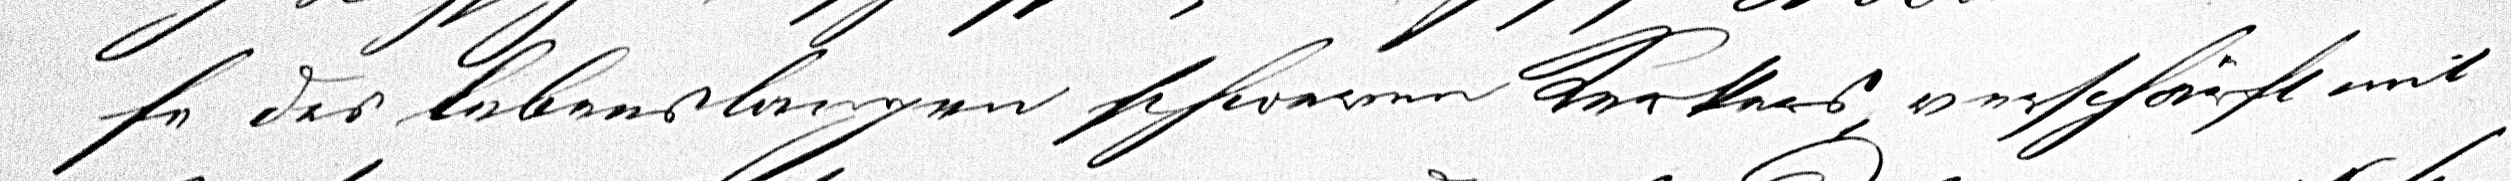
fe des lebenslangen schweren Kerkers, verschärft mit
